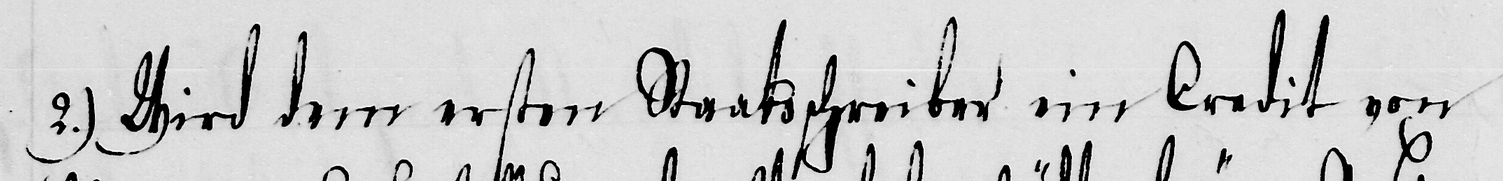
2.) Wird dem ersten Staatsschreiber ein Credit von
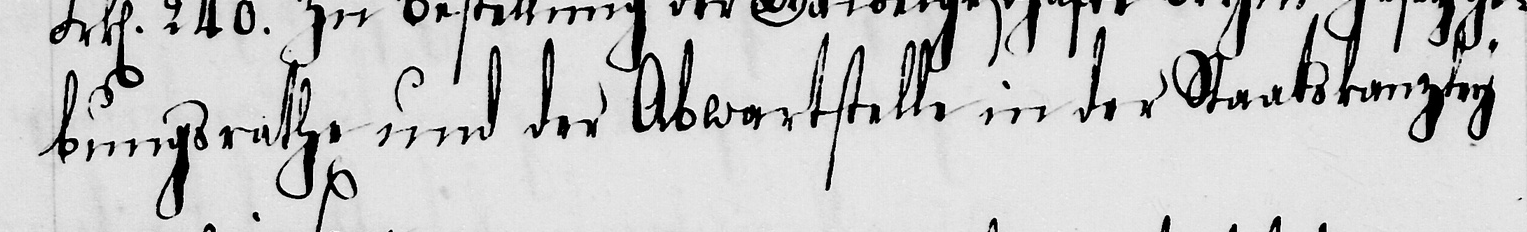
bungsrathe und der Abwartstelle in der Staatskanzl¬
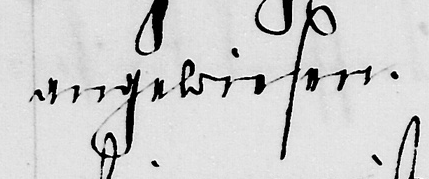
angewiesen.
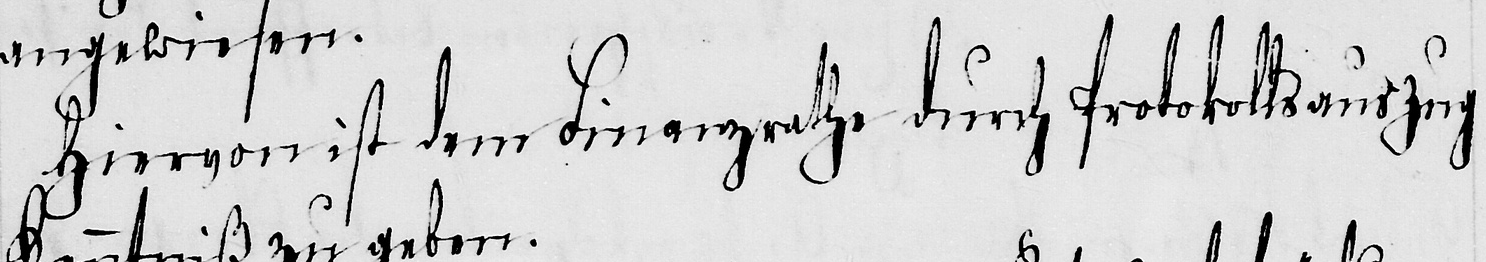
Hiervon ist dem Finanzrathe durch Protokollsausz¬
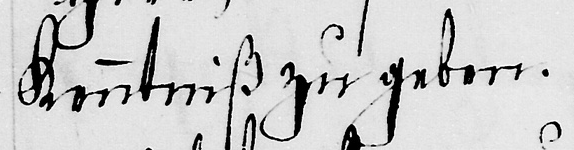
Kenntniß zu geben.
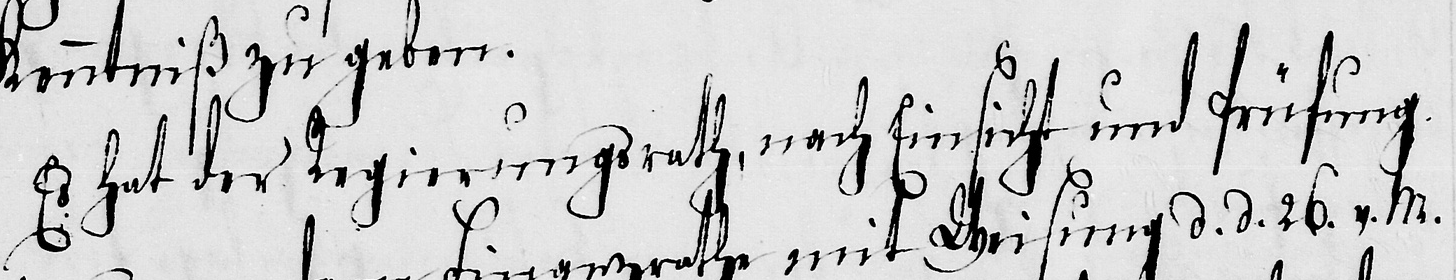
Es hat der Regierungsrath, nach Einsicht und Prüfung
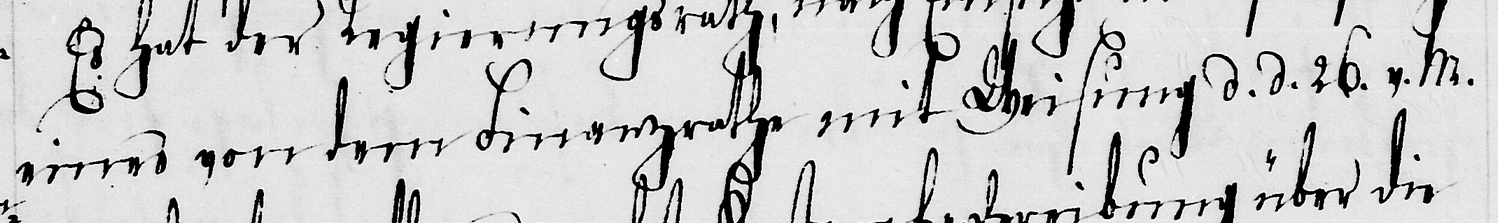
eines von dem Finanzrathe mit Weisung d. d. 26. v. M.
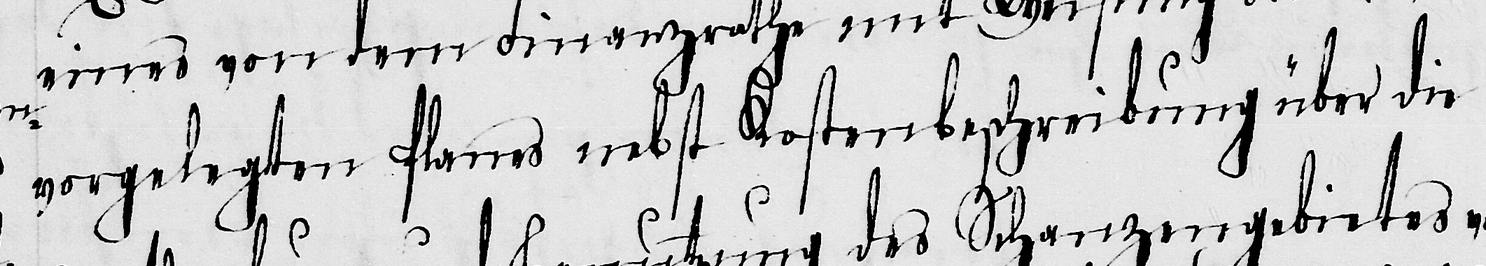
vorgelegten Planes nebst Kostenbeschreibung über die
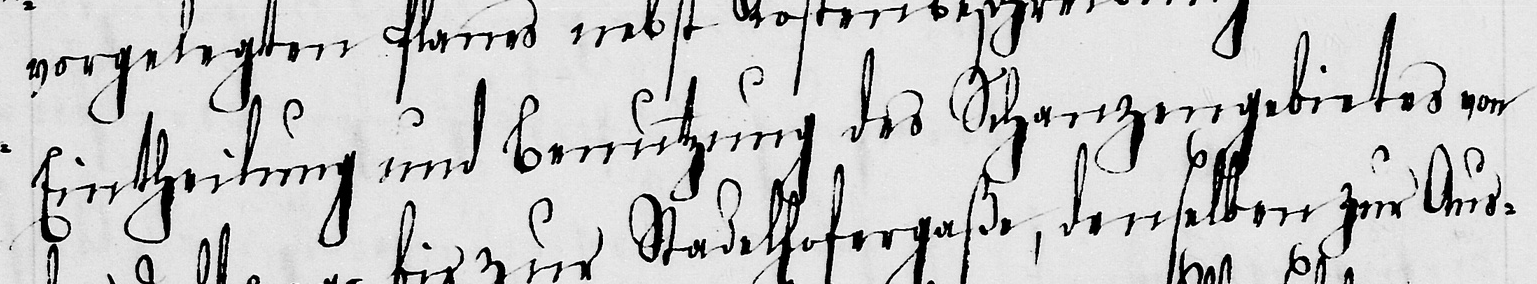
Eintheilung und Benutzung des Schanzengebietes von
